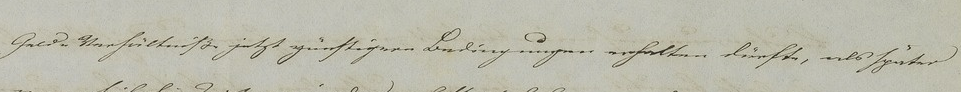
Geld-Verhältniße jetzt günstigere Bedingungen erhalten dürfte, als später
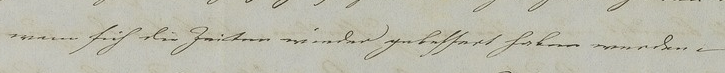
wenn sich die Zeiten wieder gebessert haben werden. –
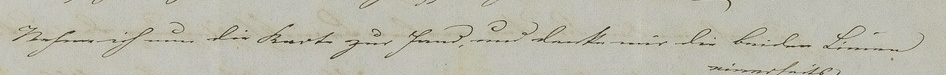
Nehme ich nun die Karte zur Hand, und denke mir die beiden Linien
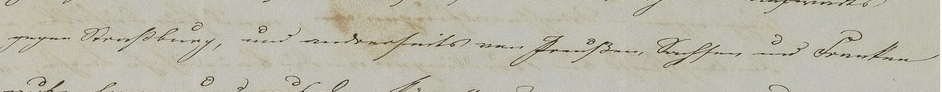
gegen Straßburg, und andrerseits von Preußen, Sachsen und Franken
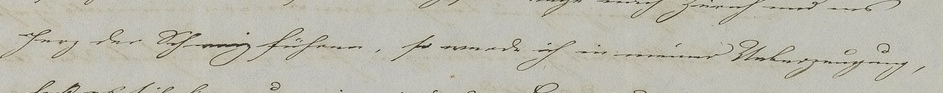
Herz der Schweiz führen, so werde ich in meiner Ueberzeugung,
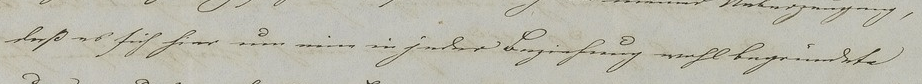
daß es sich hier um eine in jeder Beziehung wohl begründete
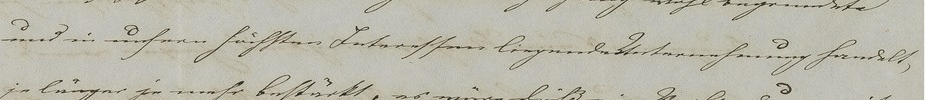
und in unsern höchsten Interessen liegende Unternehmung handelt,
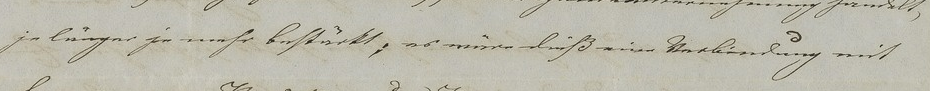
je länger je mehr bestärkt; es wäre dieß eine Verbindung mit
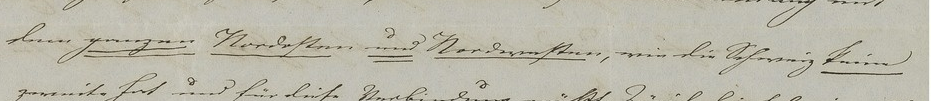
dem ganzenNordostenundNordwesten, wie die Schweiz keine
